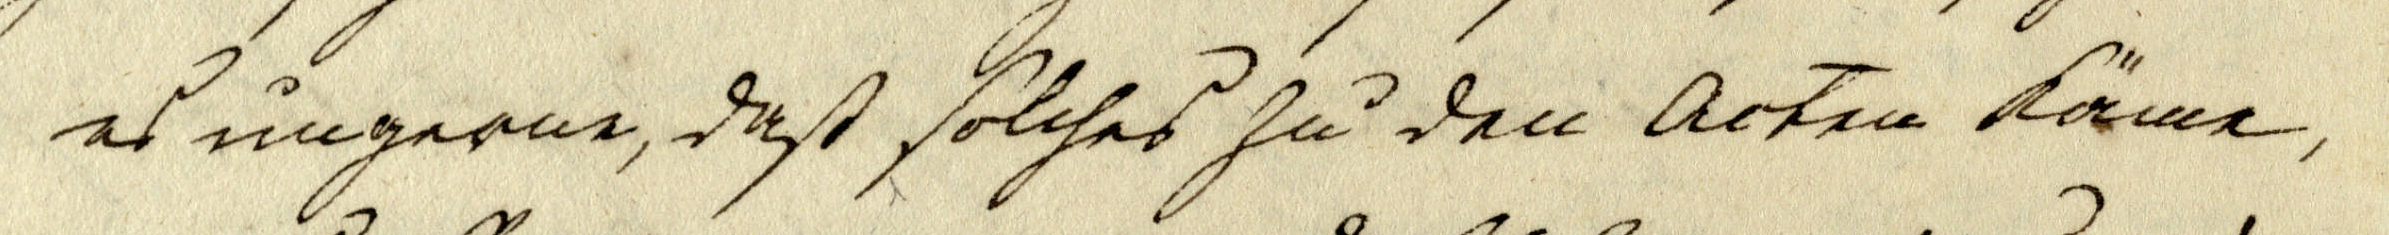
es ungerne, daß solches zu den Acten käme,
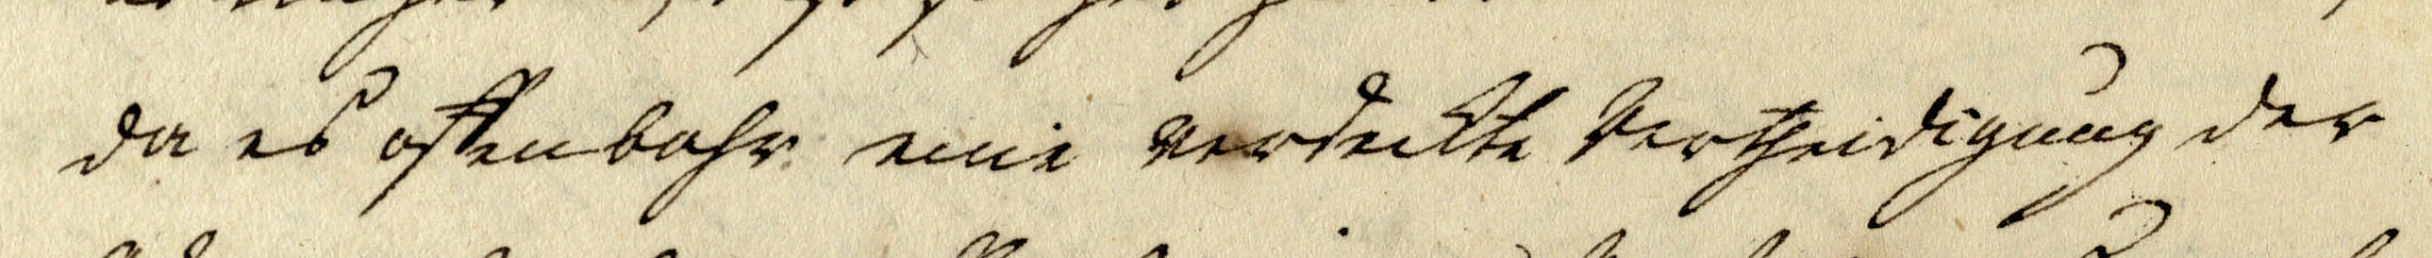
da es offenbahr eine verdeckte Vertheidigung der
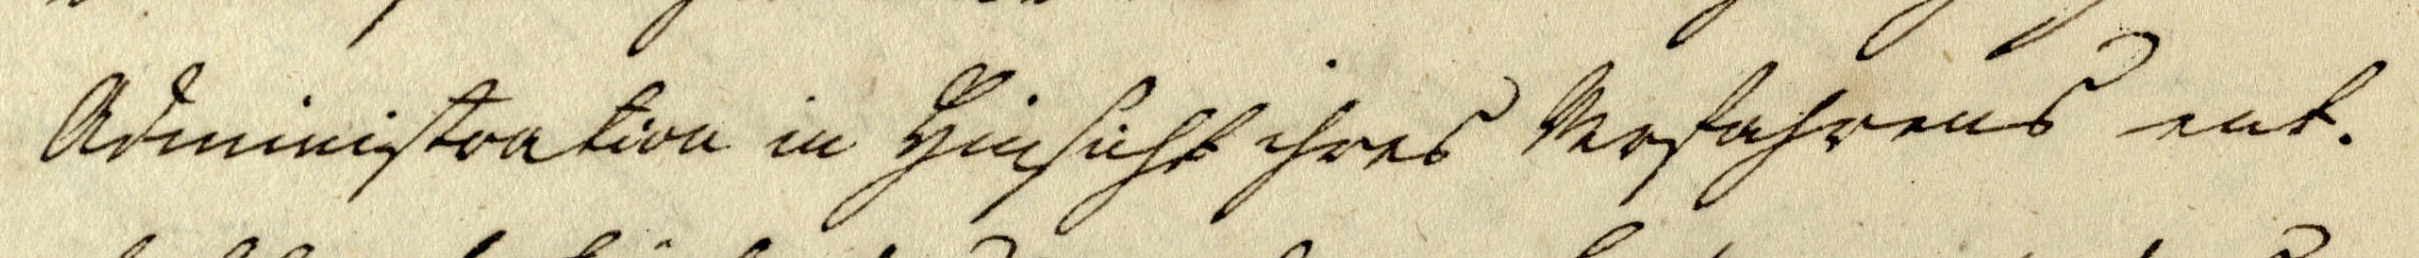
Administration in Hinsicht ihres Verfahrens ent¬
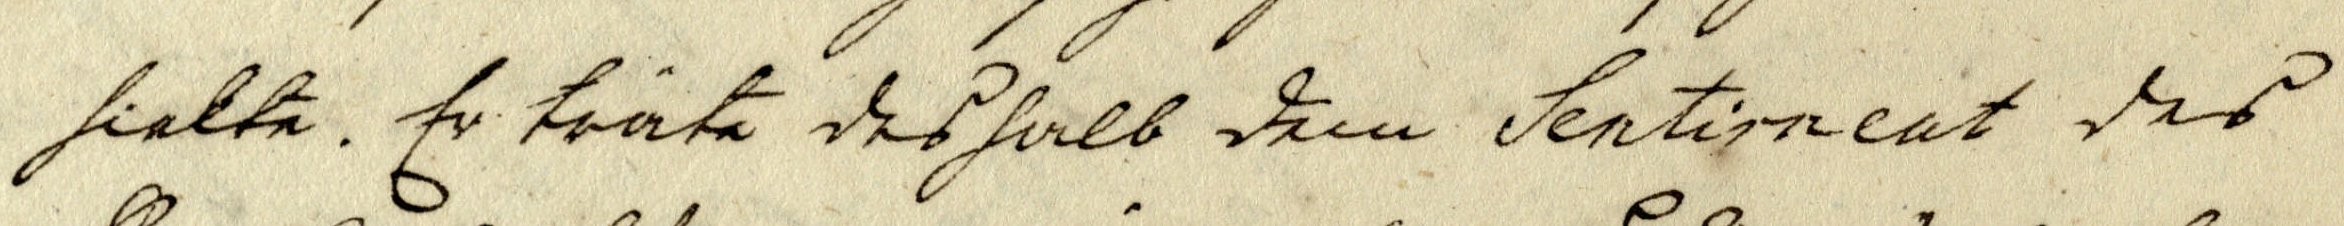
hielte. Er träte deshalb dem Sentiment des
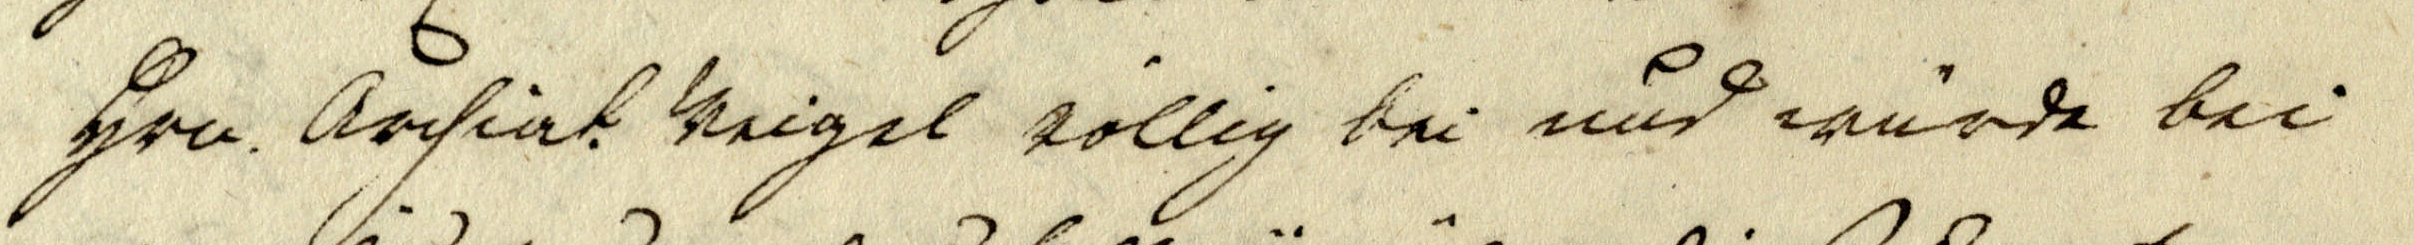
Hern. Archiat. Weigel völlig bei und würde bei
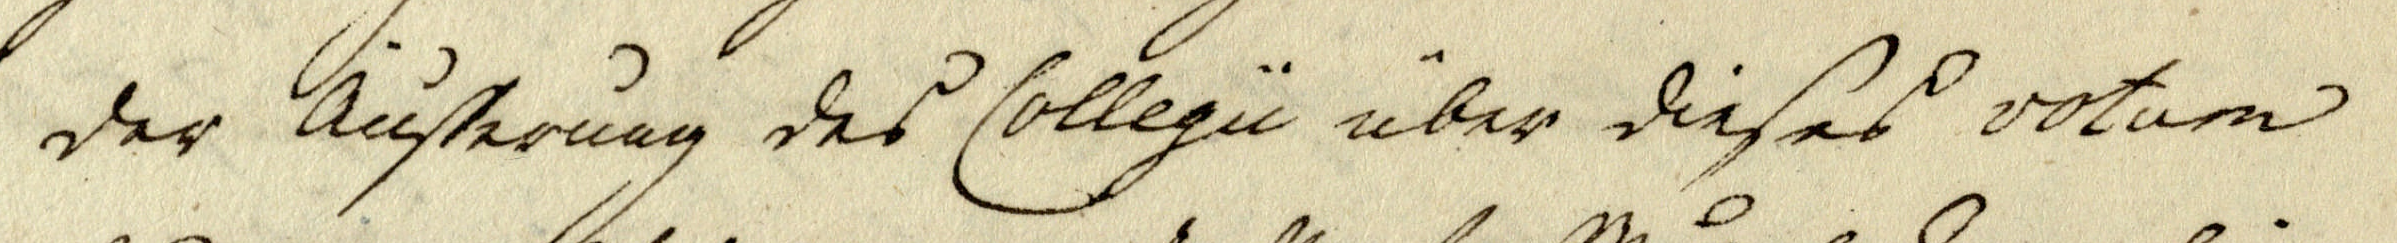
der Äusserung des Collegii über dieses votum
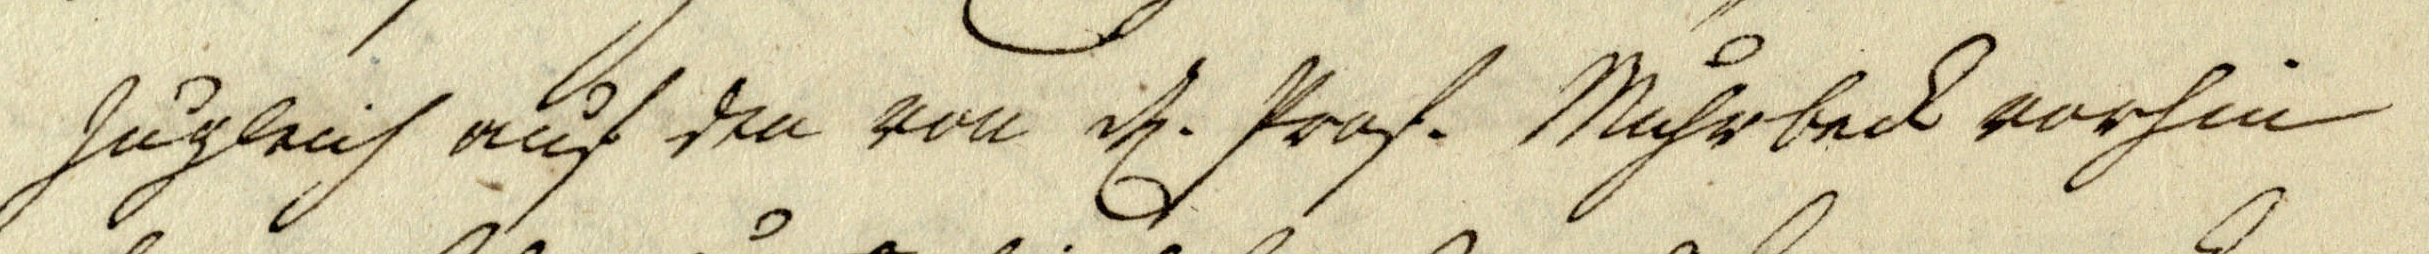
zugleich auf den von dh. Prof. Muhrbeck vorhin
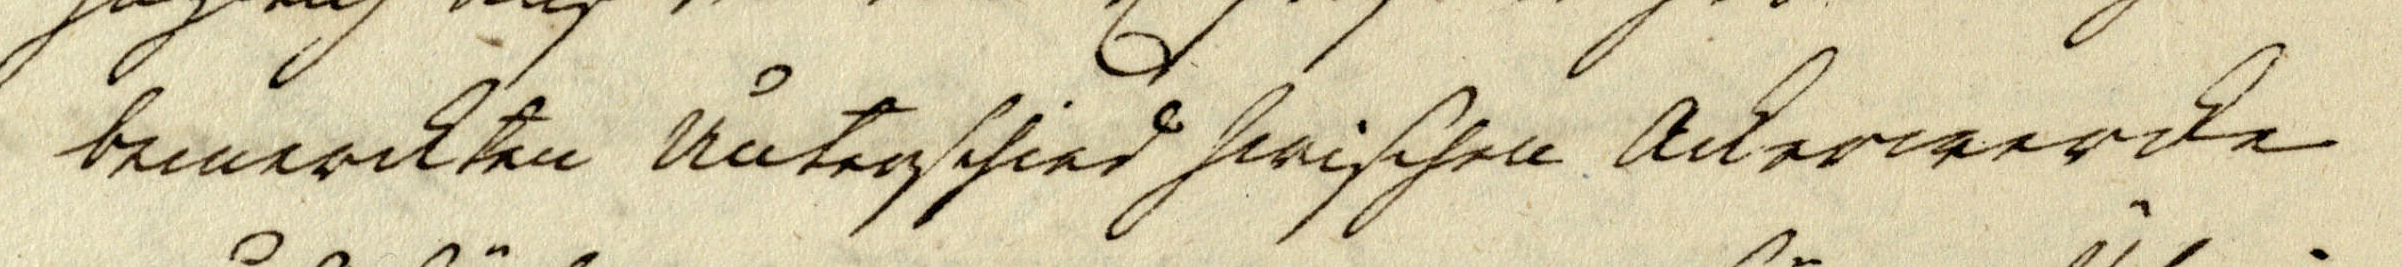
bemerckten Unterschied zwischen Ackerwercke
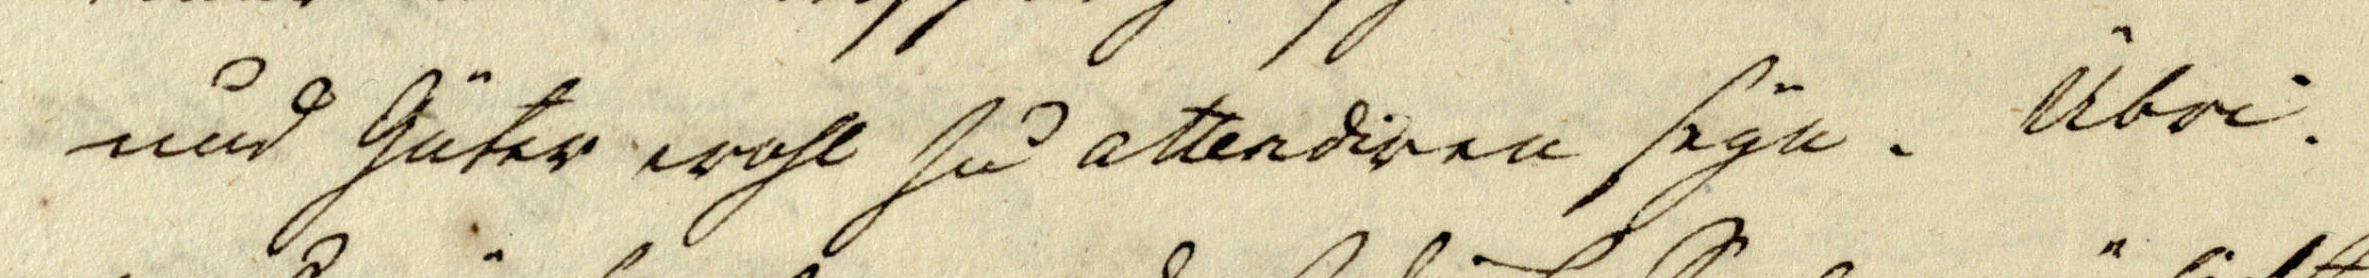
und Güter wohl zu attendiren seÿn . Übri¬
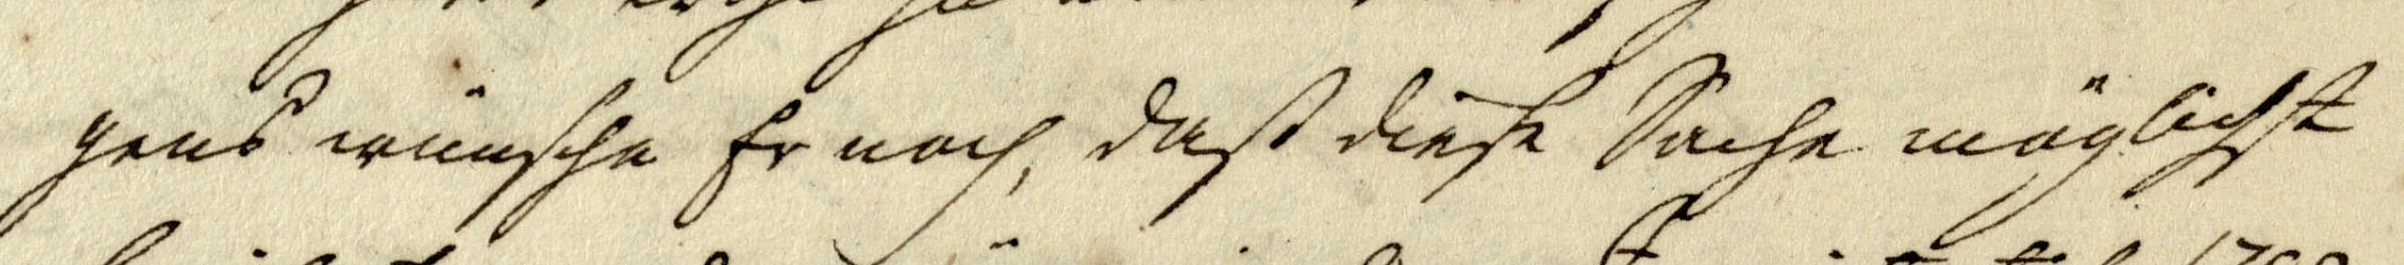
gens wünsche Er noch, daß diese Sache möglichst
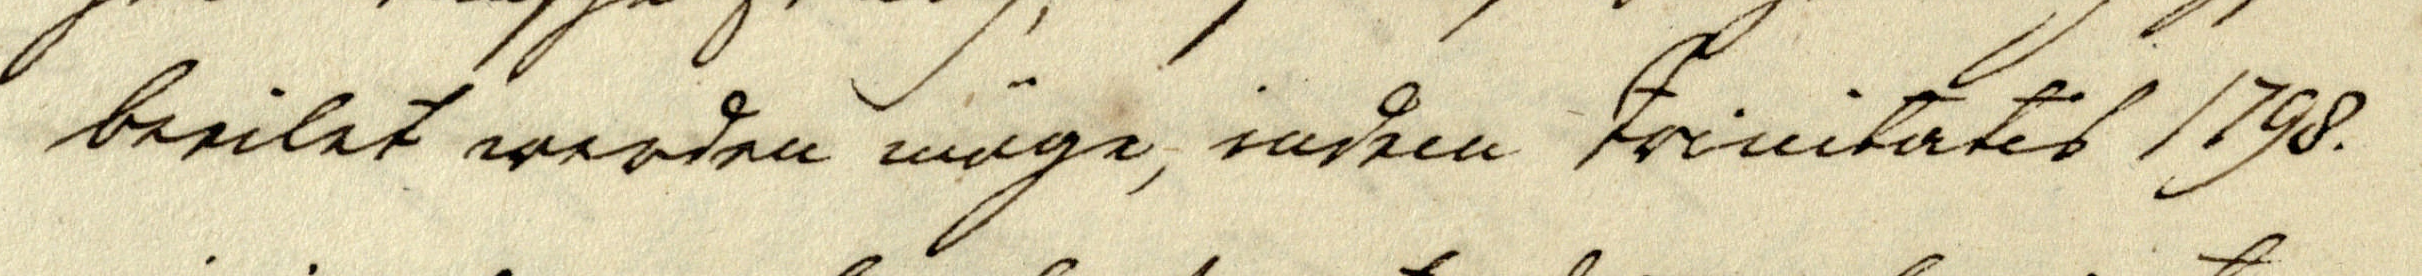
beeilet werden möge, indem Trinitatis 1798.
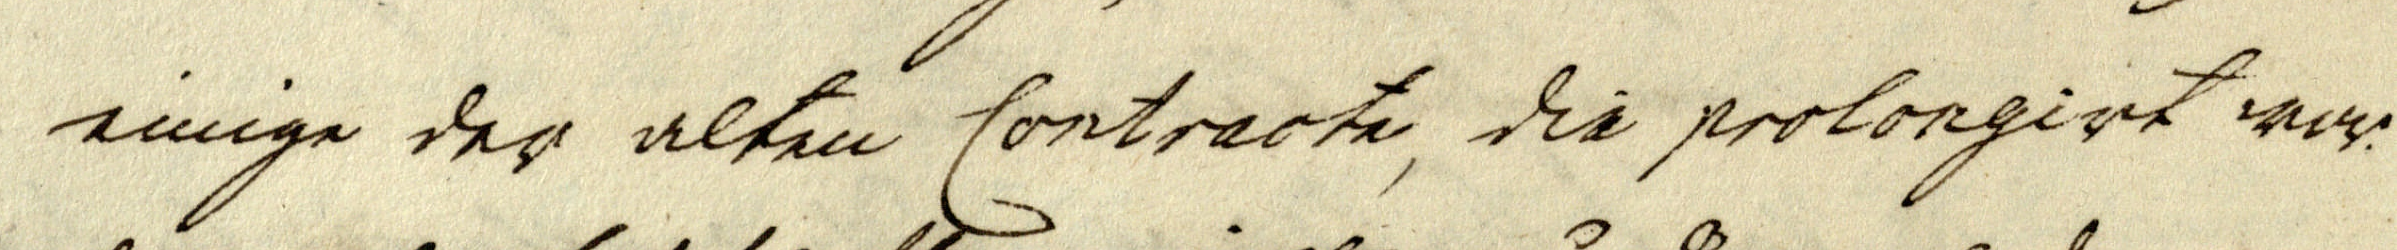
einige der alten Contracte, die prolongirt wor¬
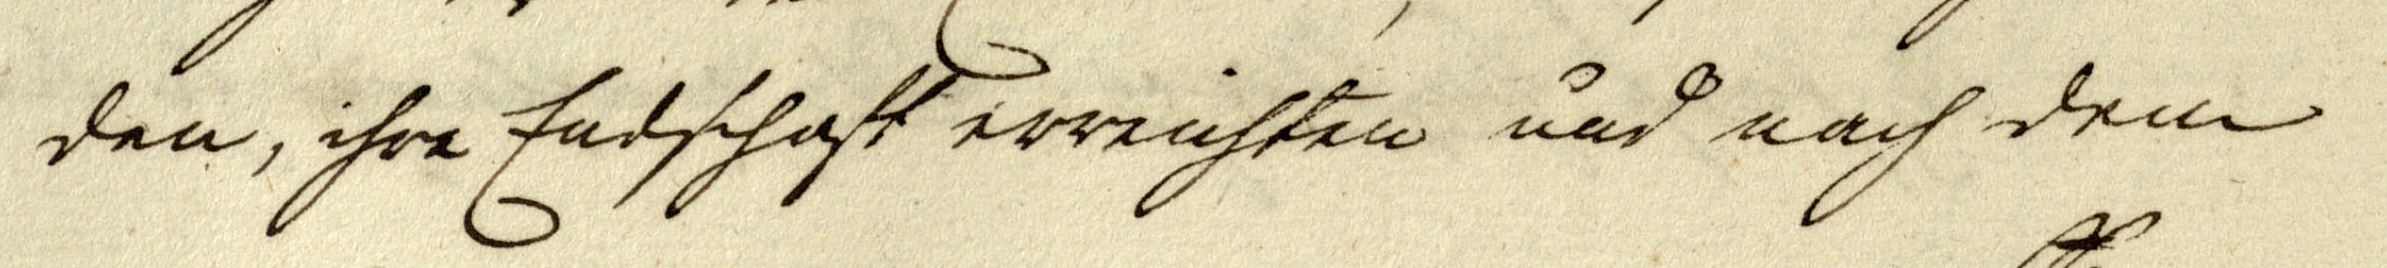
den, ihre Endschaft erreichten und nach dem
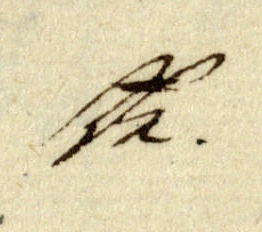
Re
